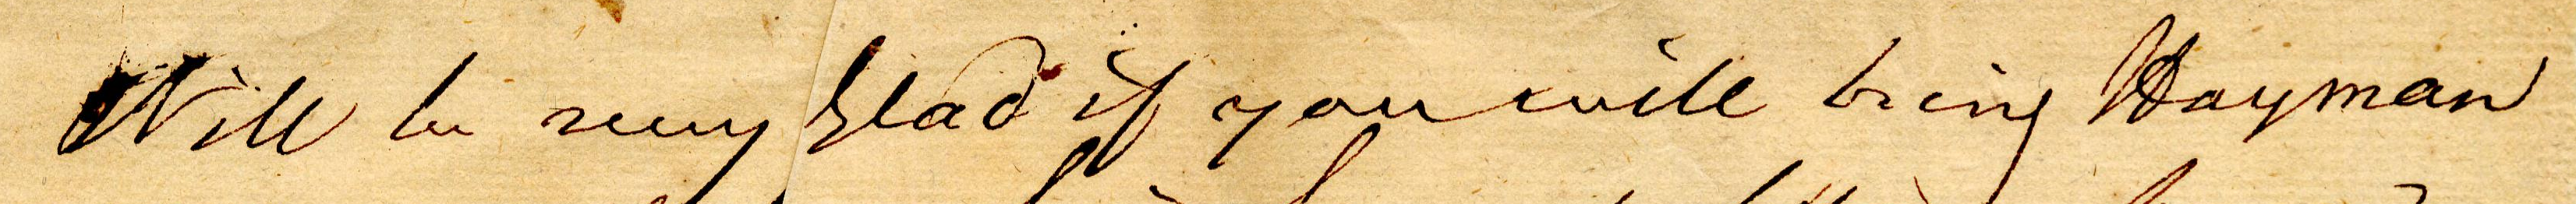Will be very Glad if you will bring Hayman
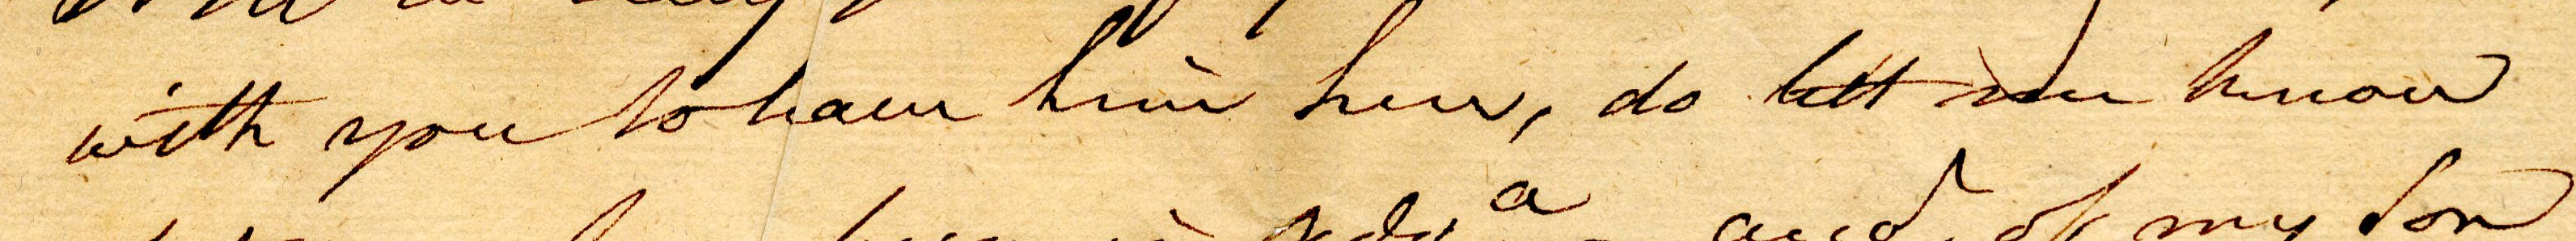with you to have him here, do lett me know
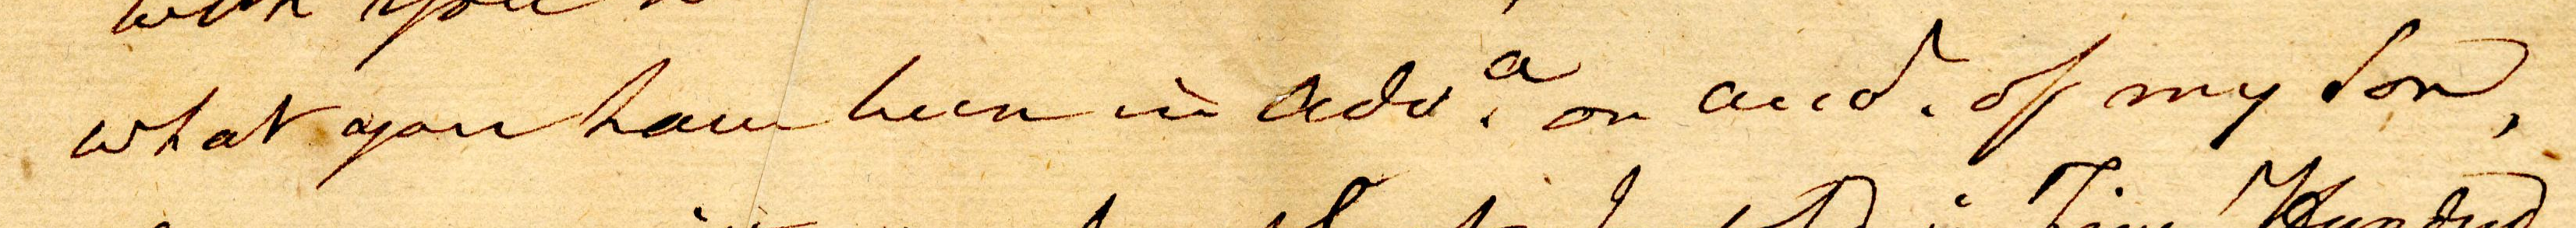what you have been in occ^a. on acco^t of my son,
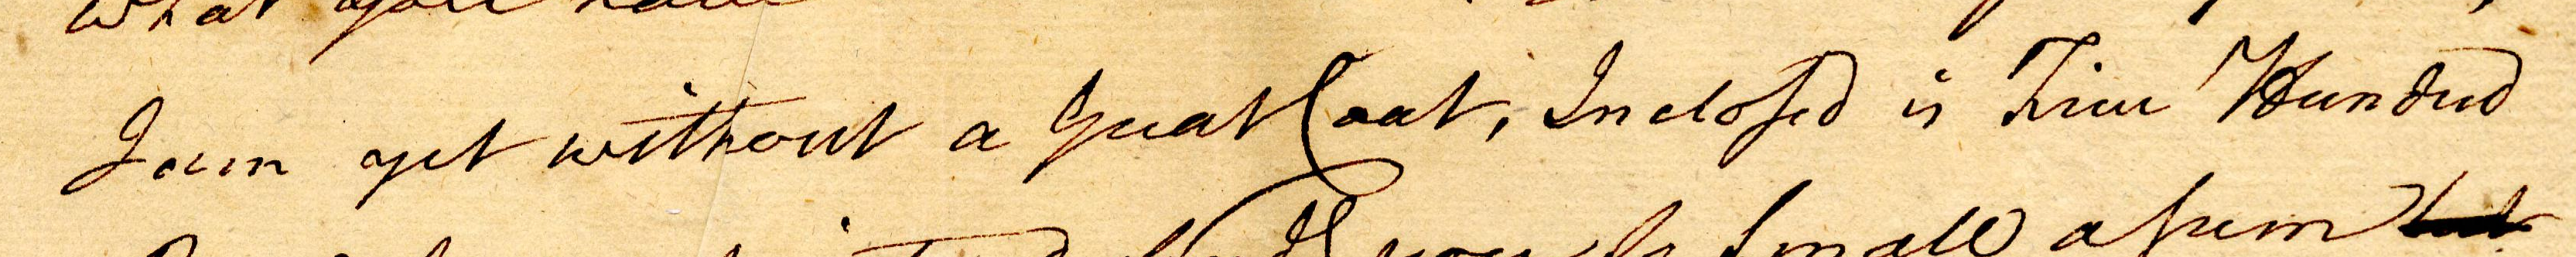I am yet without a great Coat, Inclosed is five Hundred
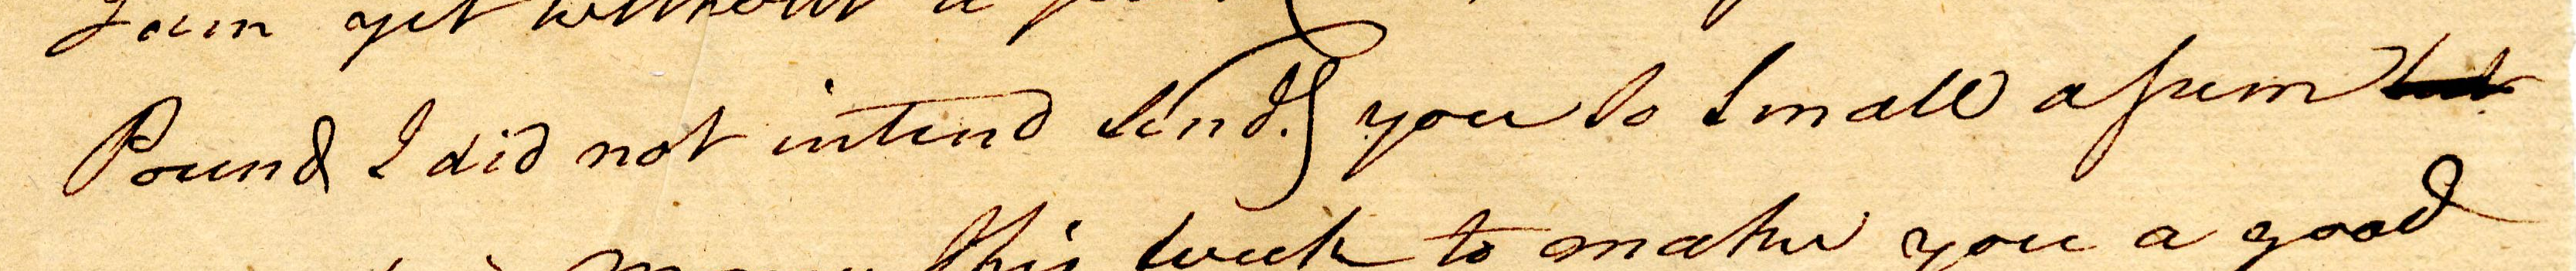Pound I did not intend send^g. you so small a sum [but]
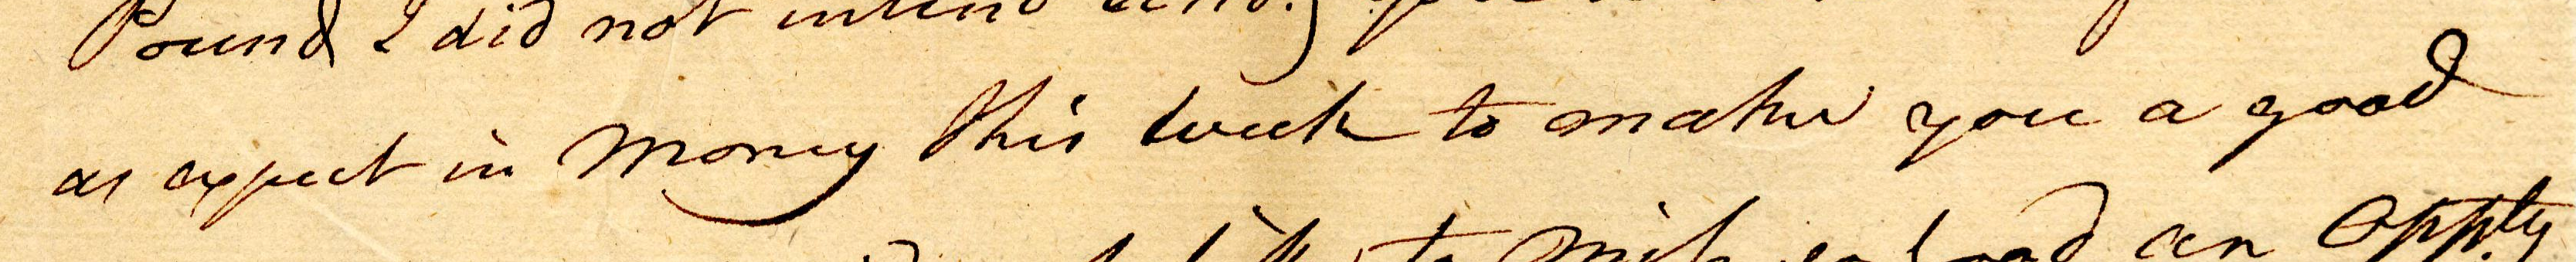as expect in money this week to make you a good
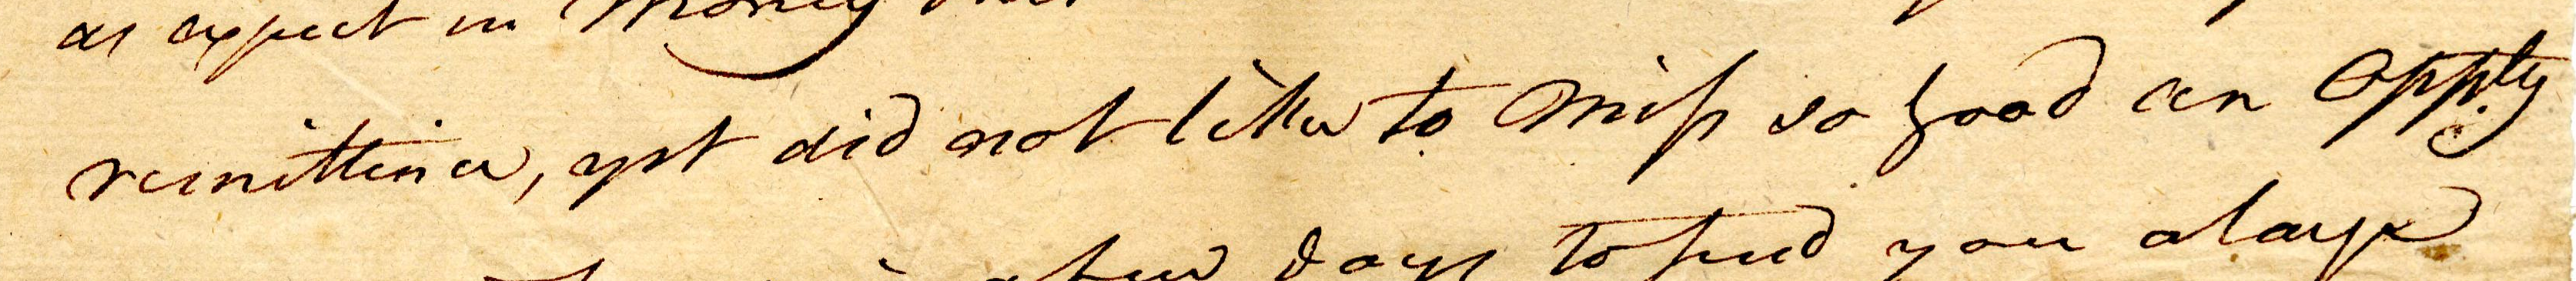remittence, yet did not like to miss so good an opp^ty
